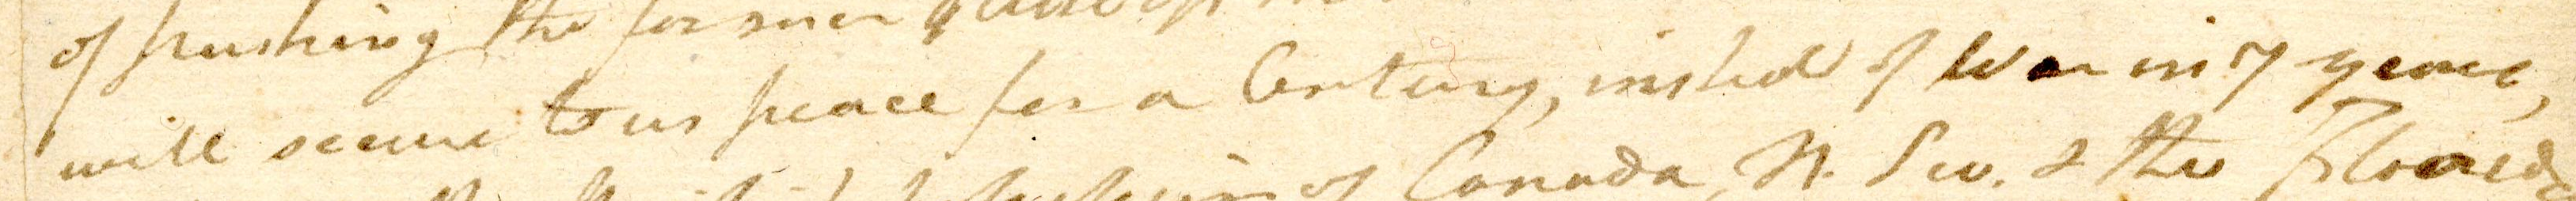will serve to us peace for a Century, instead of War in 7 years
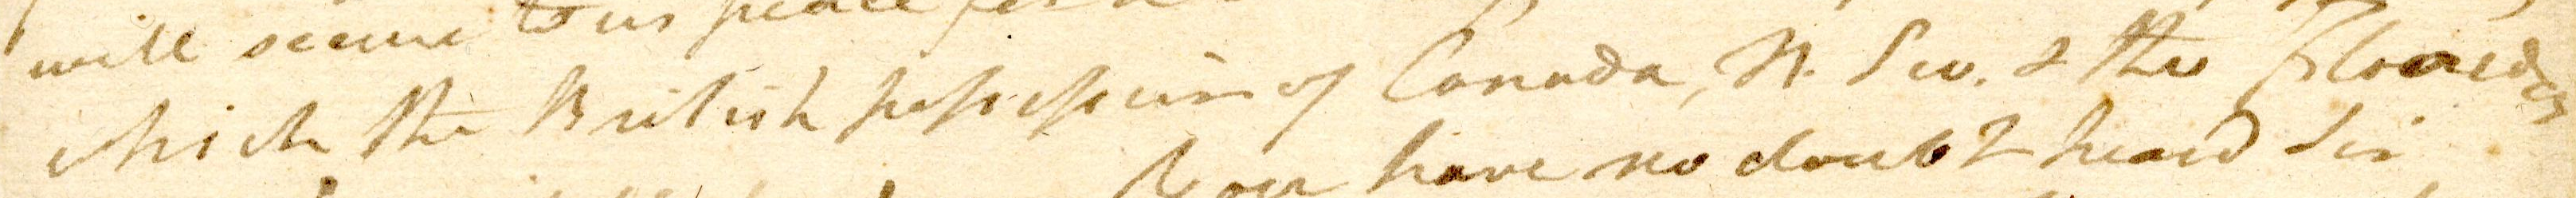which the British possession of Canada, N. Sco. & the Islands
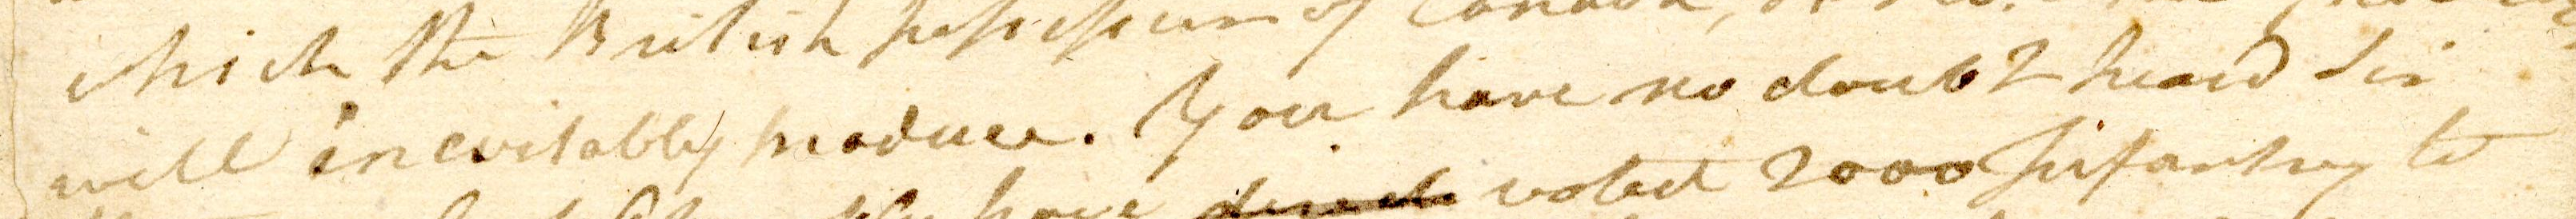will inevitably produce. You have no doubt heard sir
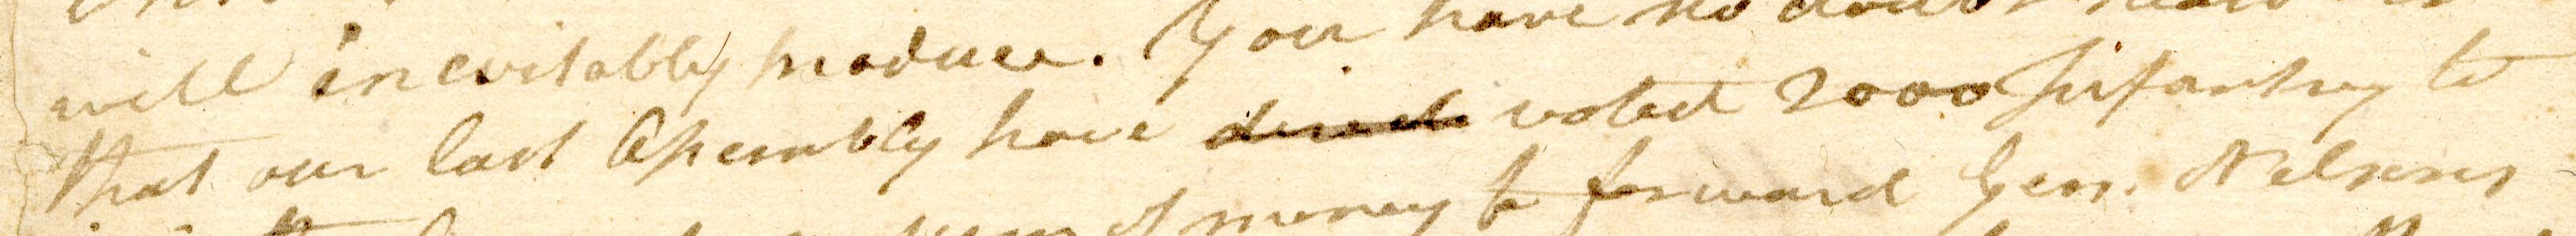that our last assembly have [direct] voted 2000 infantry to
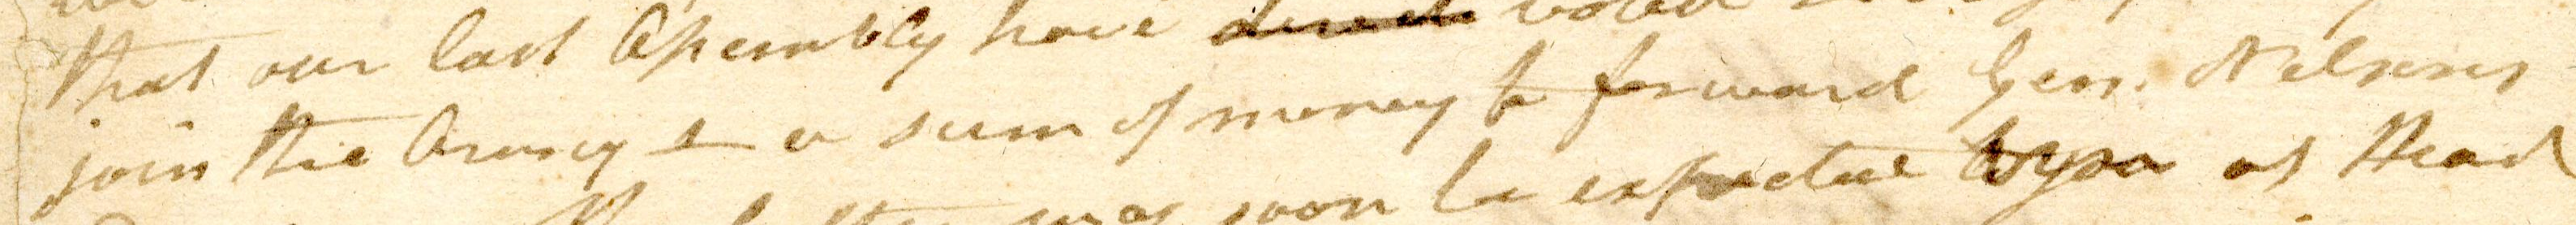join the Army & a sum of money to forward Gen. Nelsons
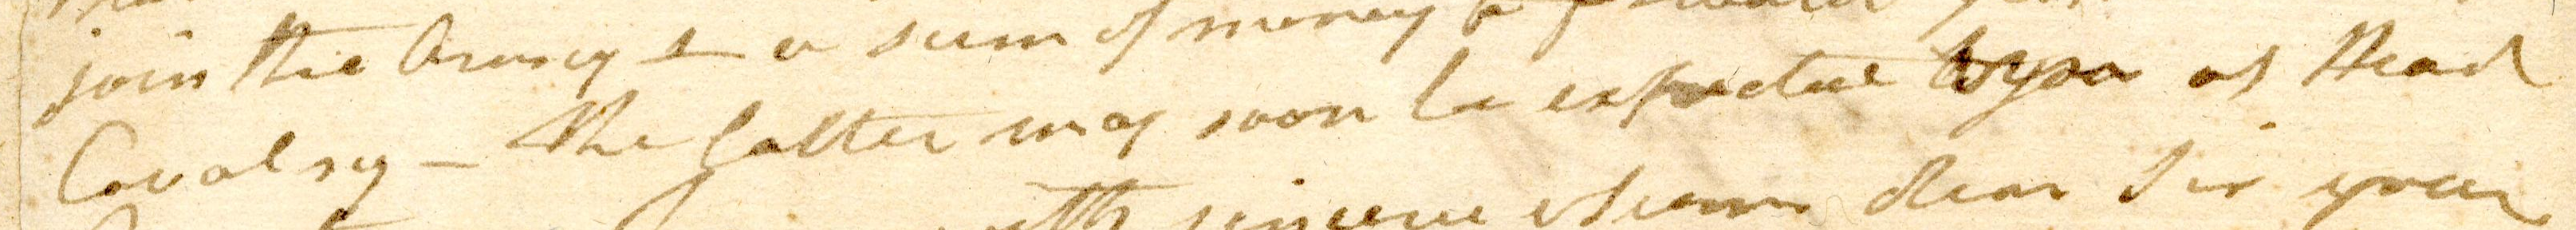Cavalry- The latter mas soon be expected [to you] at Head
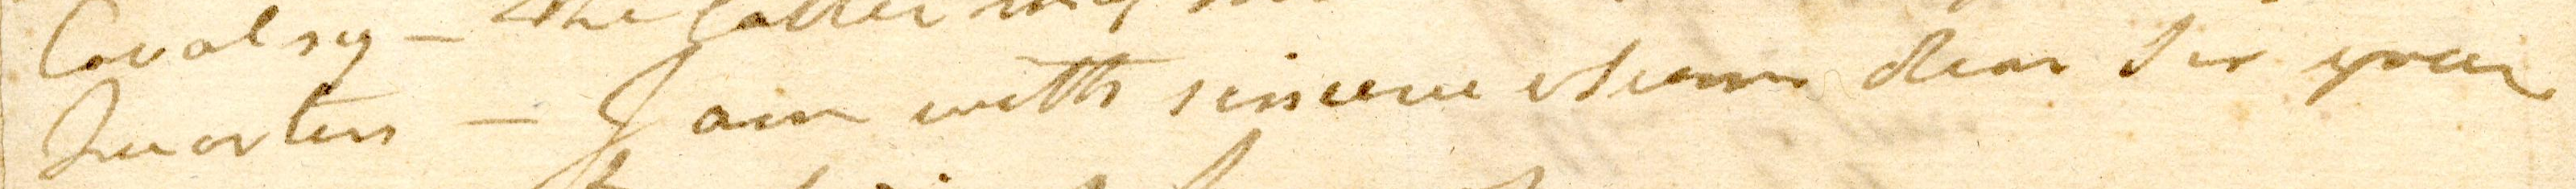Quarters.- I am with sincere esteem dear Sir your
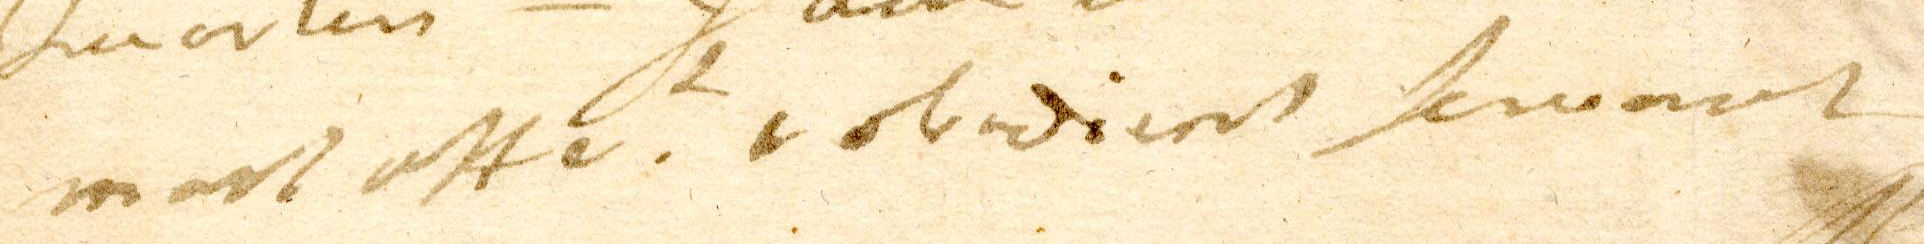most Hm^l & obedient servant
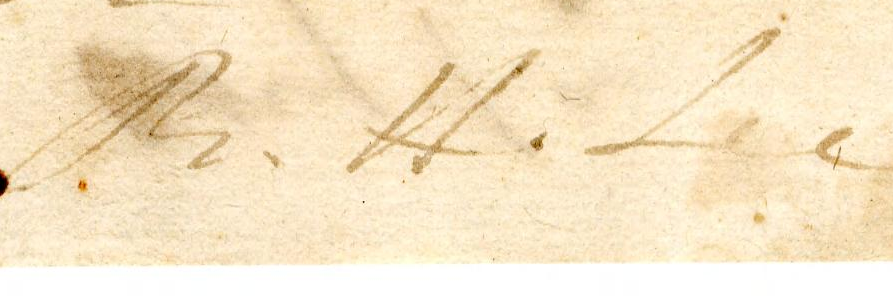R. H. Lee
